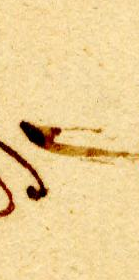To
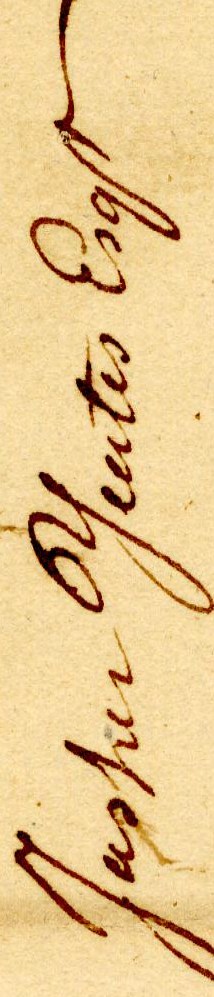Jasper Yeates Esq^r
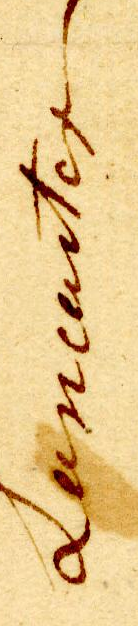Lancaster
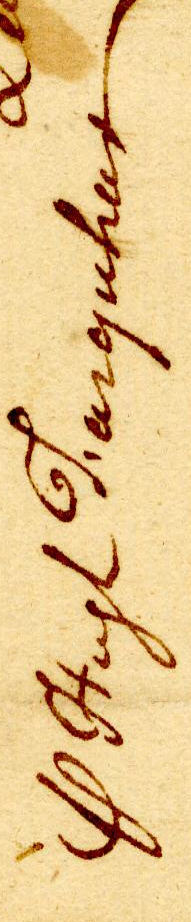per Hugh Farquhat
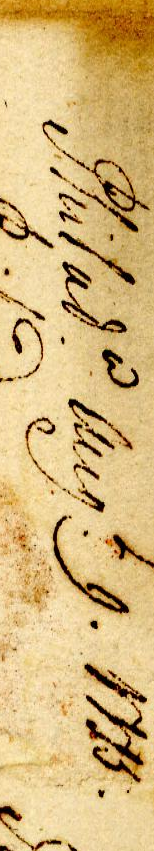Philad^a. Aug^t. 9. 1775.
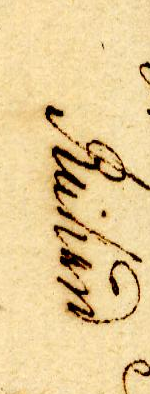Richard
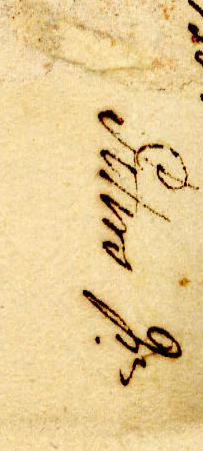Peters J^r.
